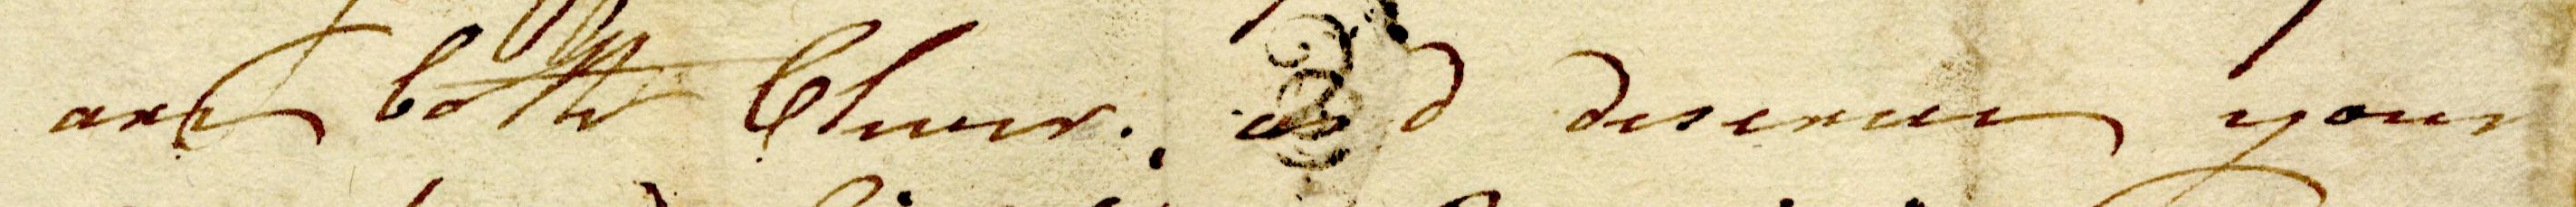are both Clever, and deserve your
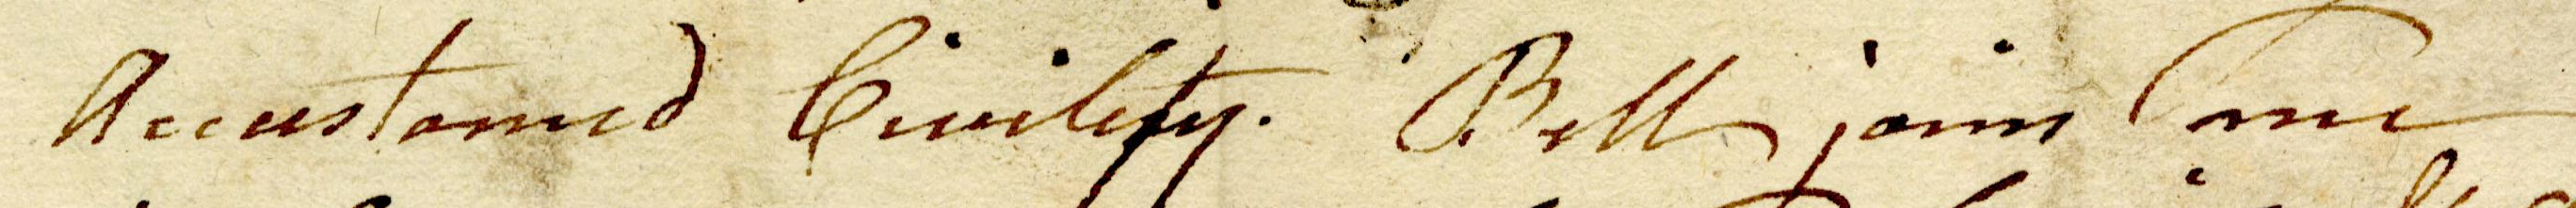Accustomed Civility. Bell joins me
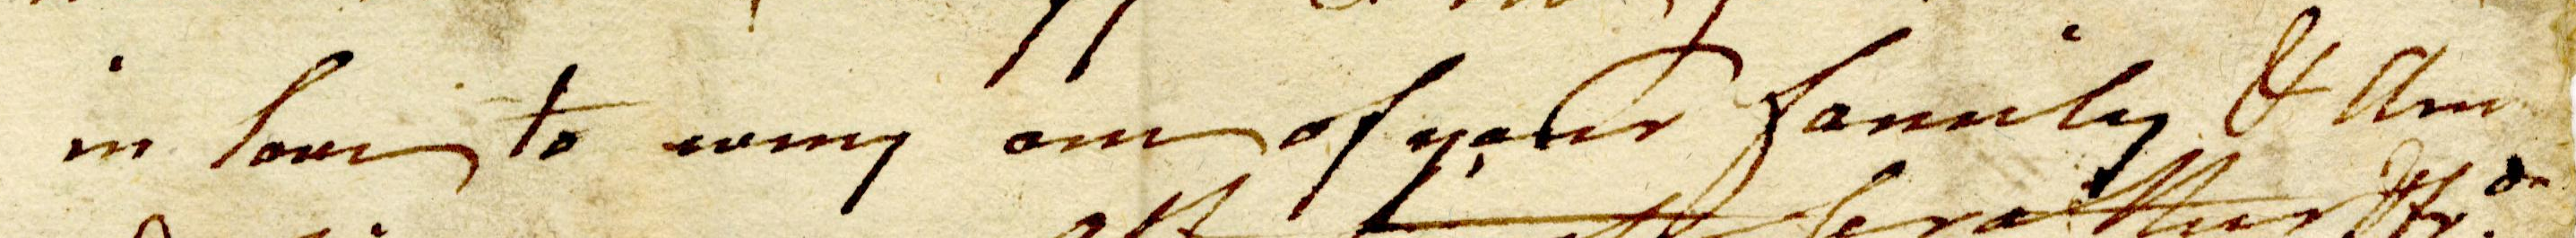in love to every one of your family & Am
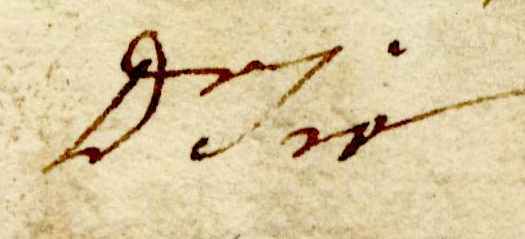D^r Sir
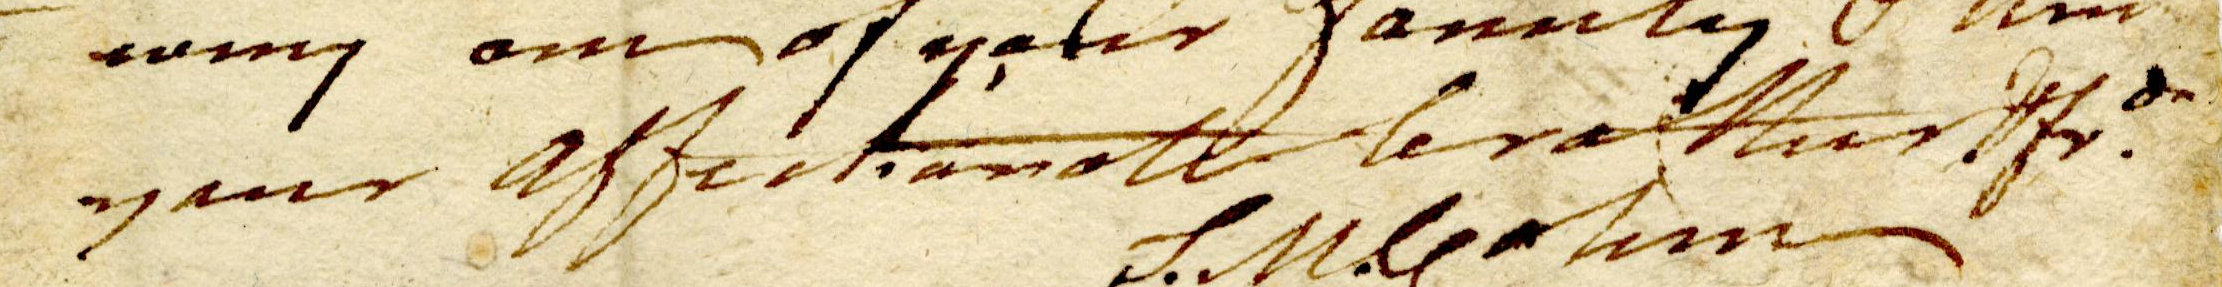your affectionate brother & fr^d.
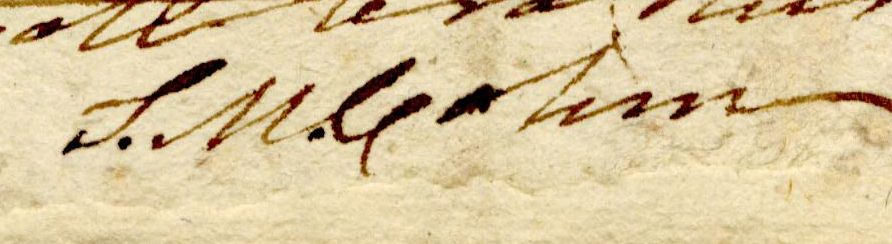S. M. Cohen
